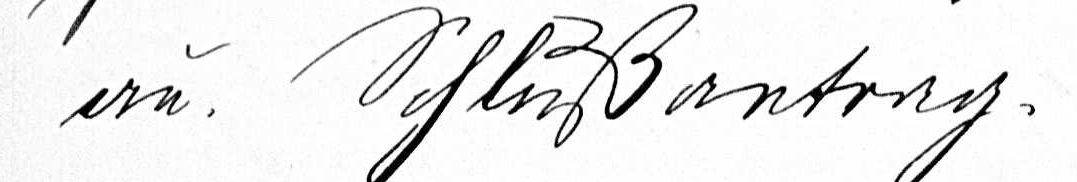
au. Schlußantrag.
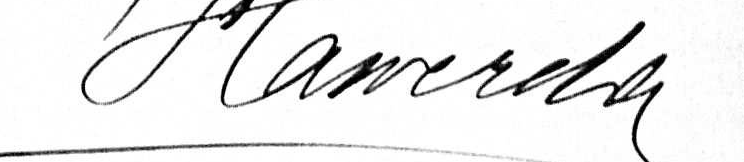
Hawerda
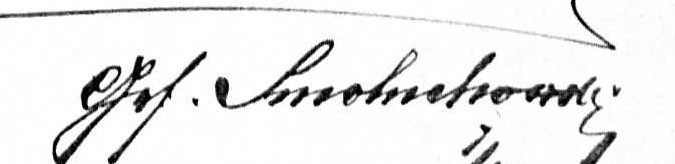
Ges. Smoluchowski
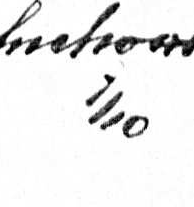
7/10
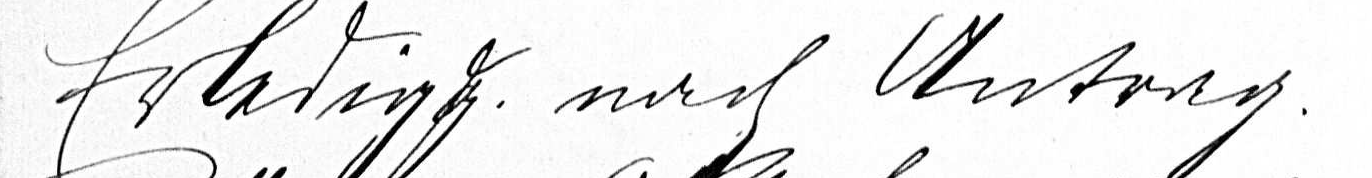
Erledigg, nach Antrag
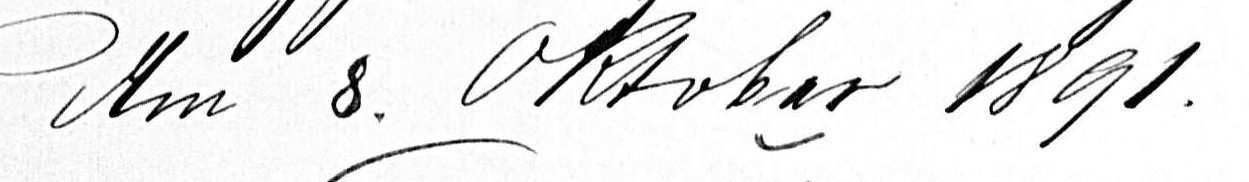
Am 8. Oktober 1891
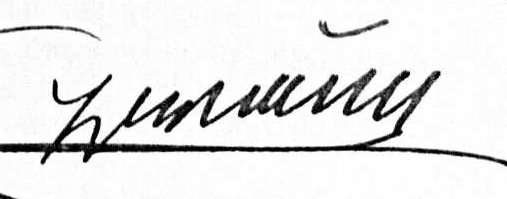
Braun
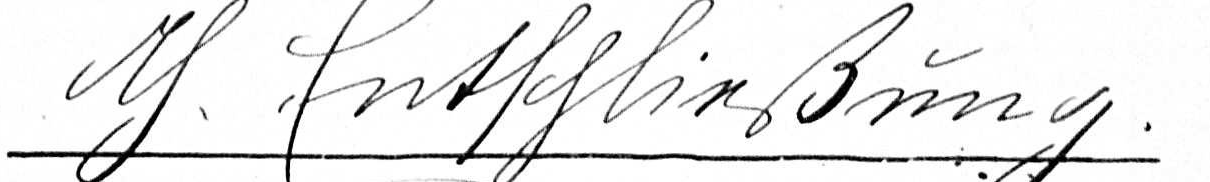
Ah. Entschließung
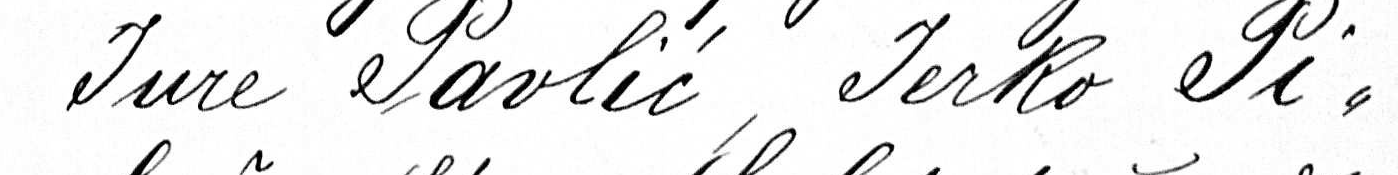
Jure Pavlić, Jerko Pi¬
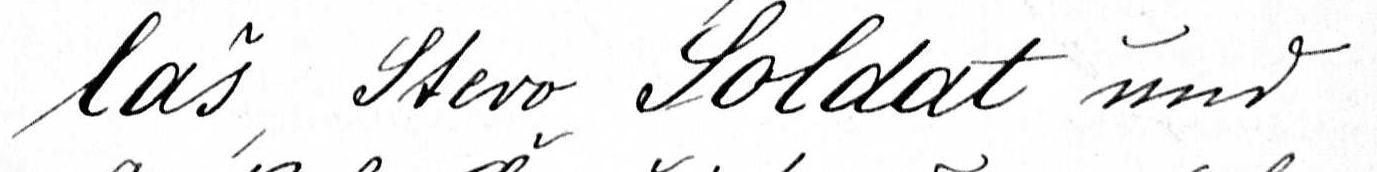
laš, Stevo Soldat und
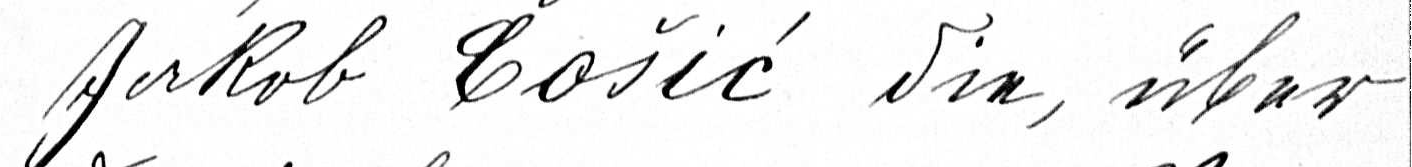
Jakob Čošić die, über
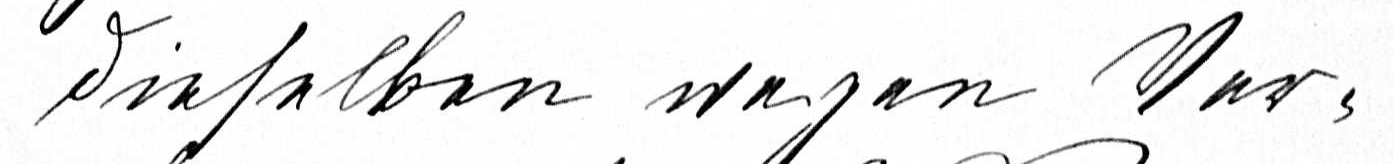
dieselben wegen Ver¬
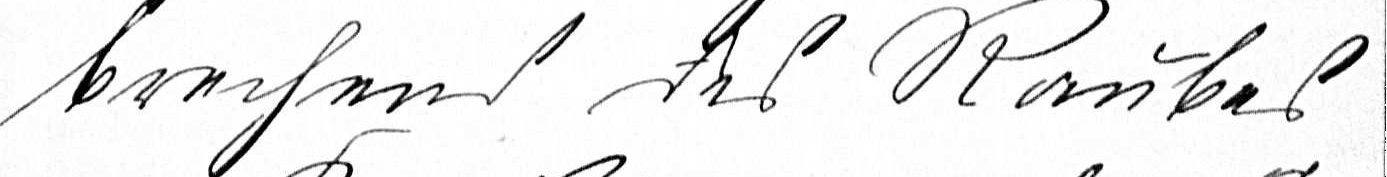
brechens des Raubes
